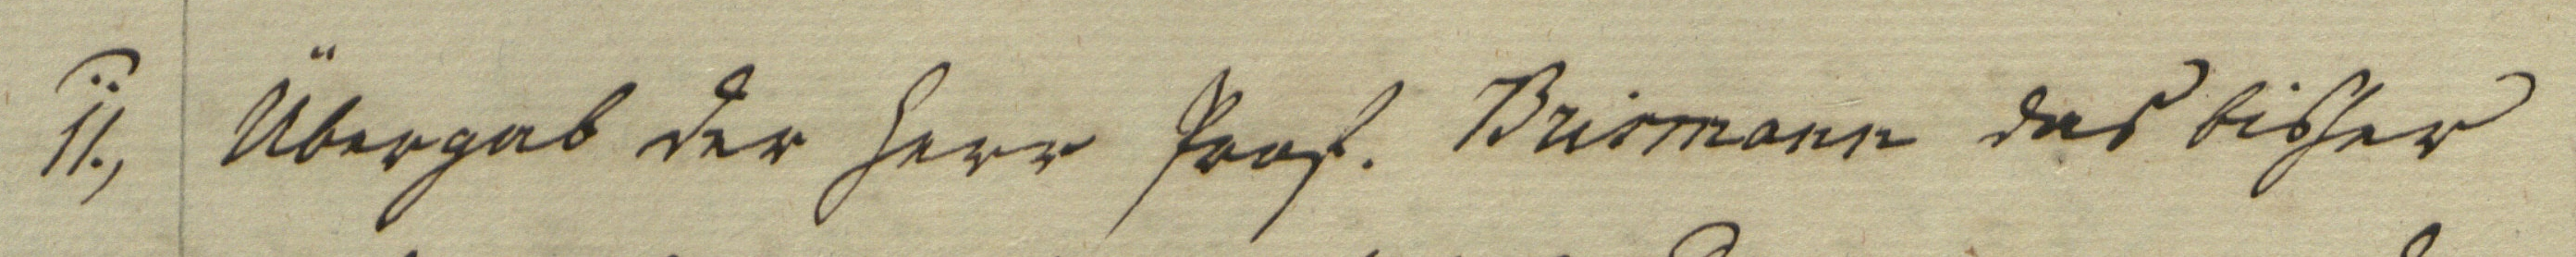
11., Übergab der Herr Prof. Brismann das bisher
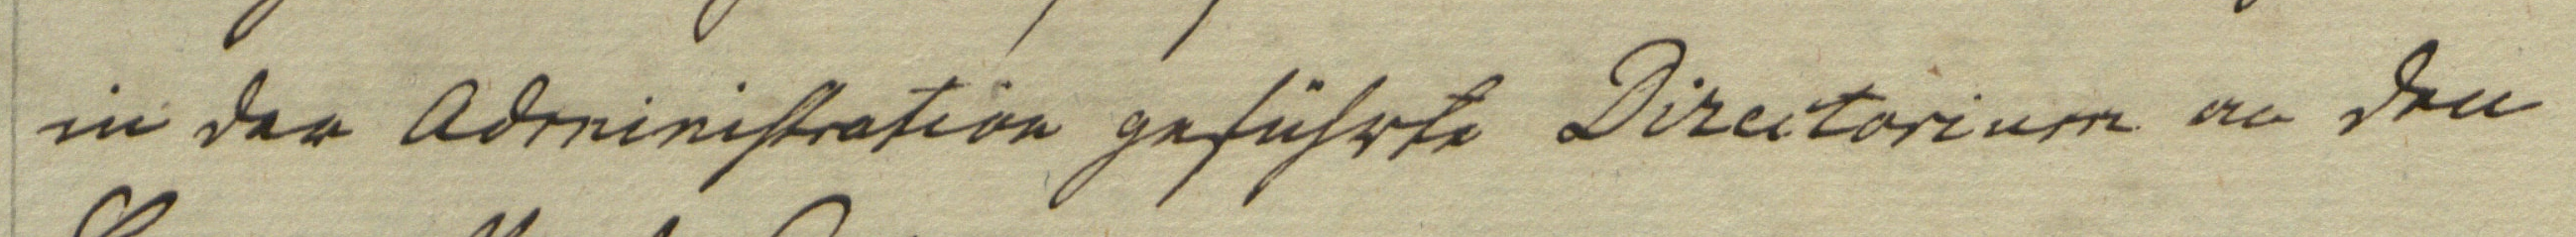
in der Administration geführte Directorium an den
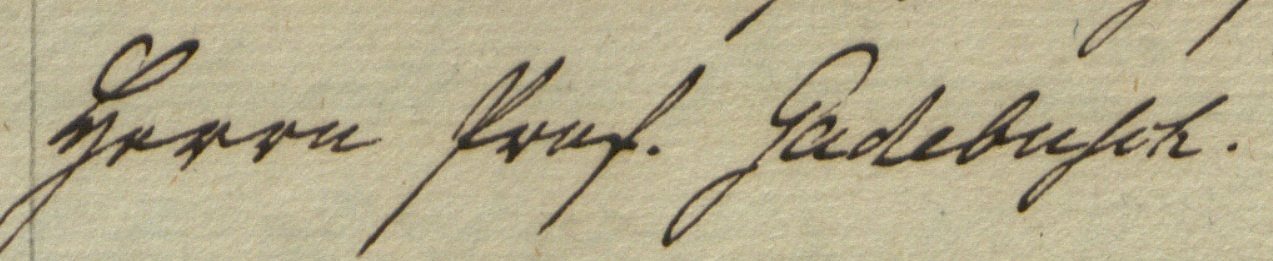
Herrn Prof. Gadebusch.
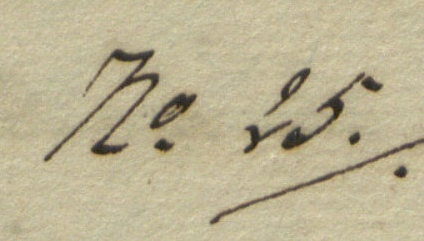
No 25.
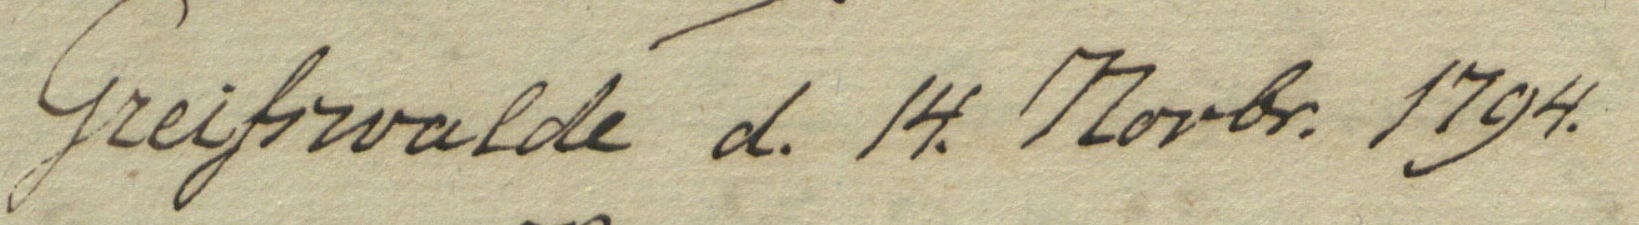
Greifswalde d. 14. Novbr. 1794.
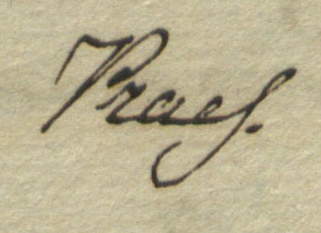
Praes.
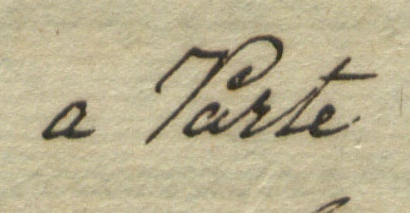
a Parte
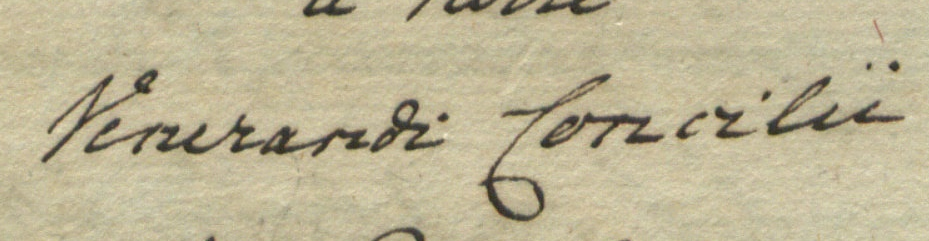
Venerandi Concilii
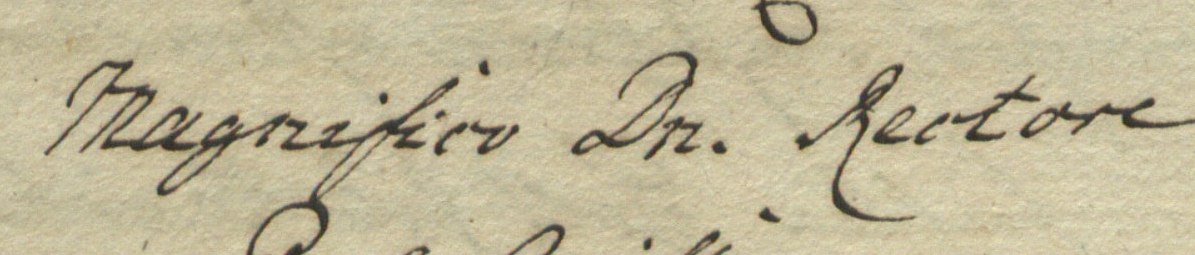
Magnifico Dn. Rectore
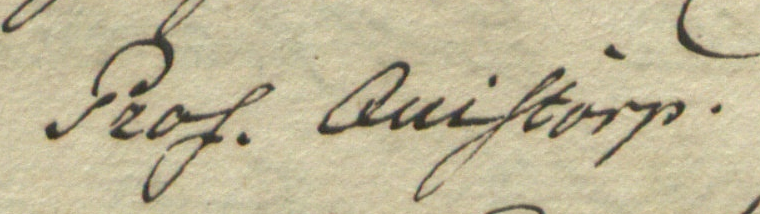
Prof. Quistorp.
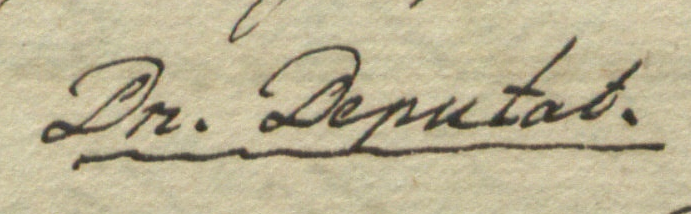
Dn. Deputat.
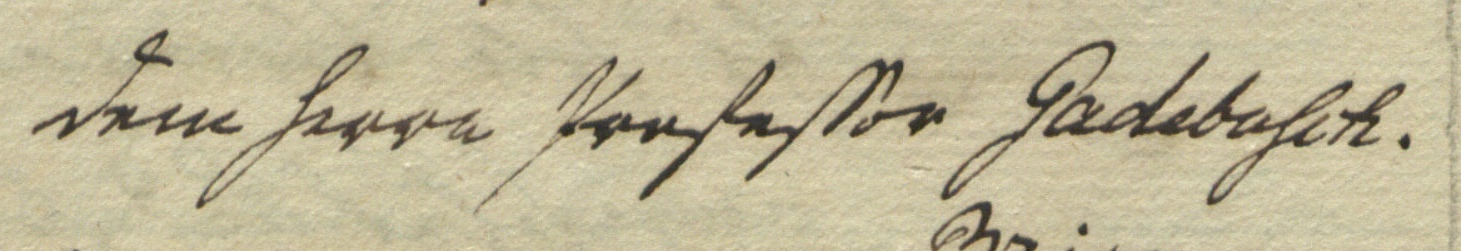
dem Herrn Professor Gadebusch.
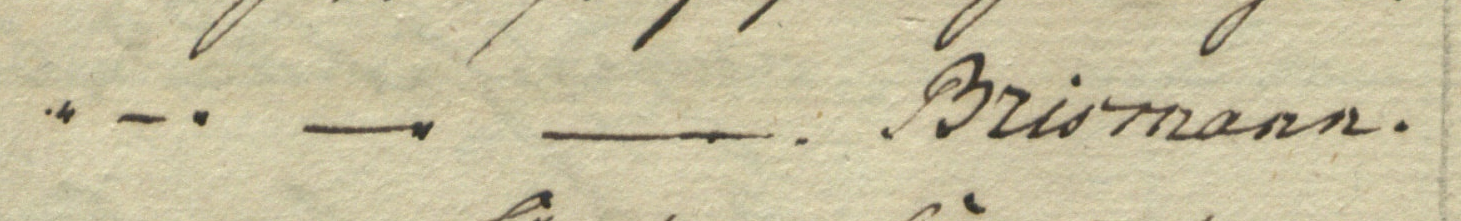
Brismann.
